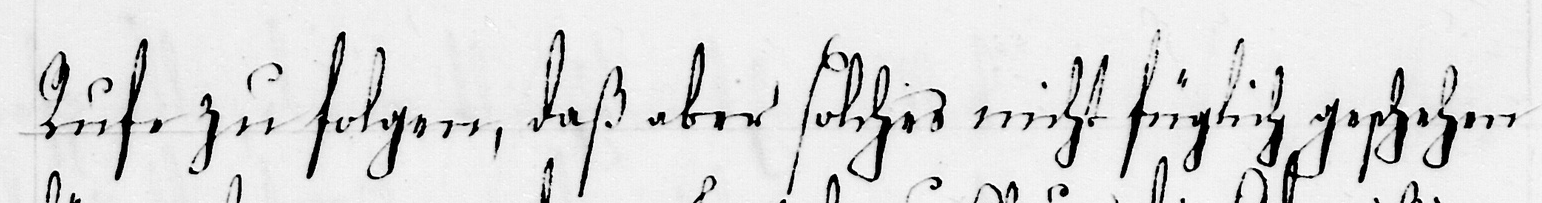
Rufe zu folgen, daß aber solches nicht füglich geschehen
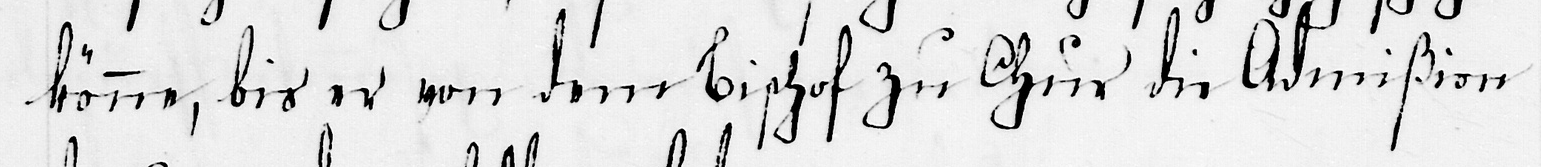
könne, bis er von dem Bischof zu Chur die Admißion
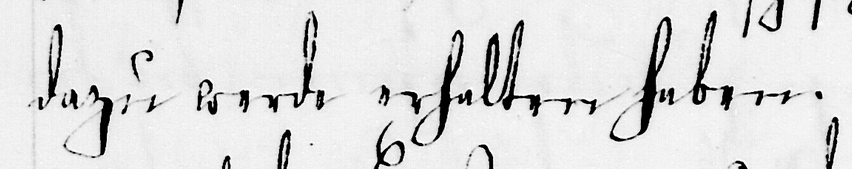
dazu werde erhalten haben.
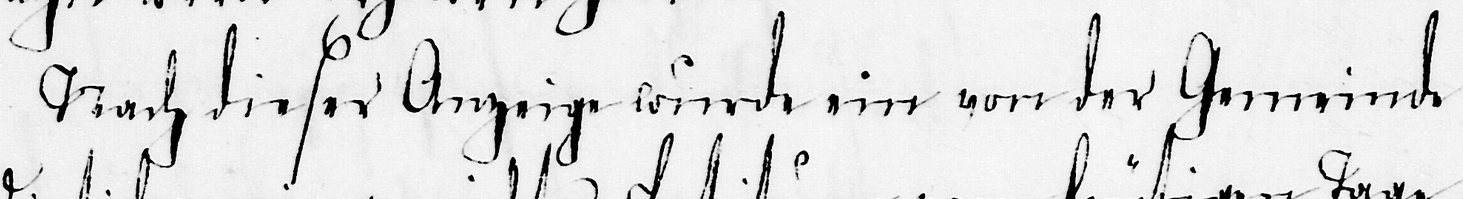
Nach dieser Anzeige wurde ein von der Gemeinde
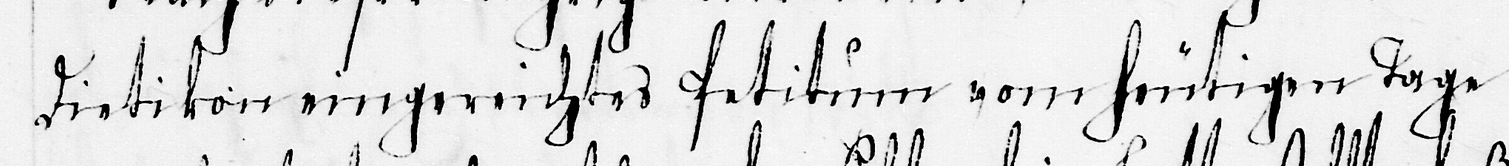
Dietikon eingereichtes Petitum vom heutigen Tage
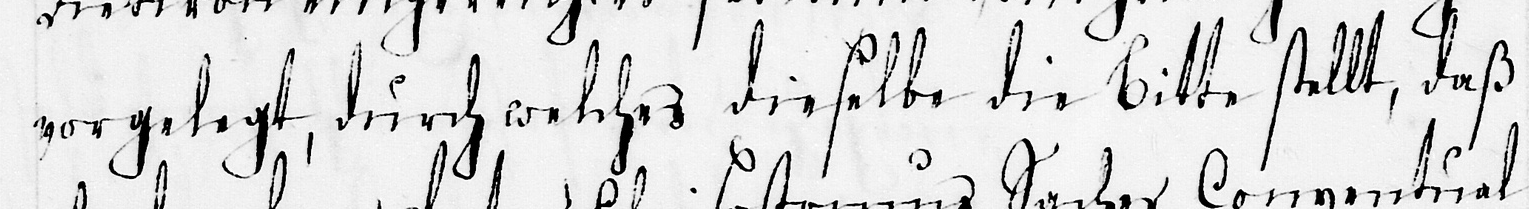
vorgelegt, durch welches dieselbe die Bitte stellt, daß
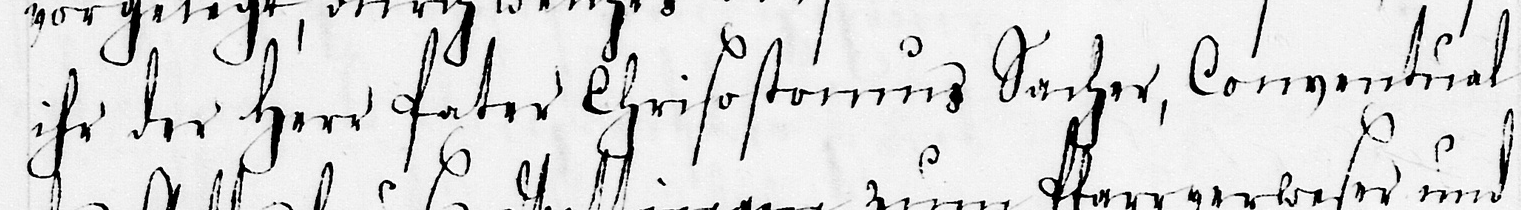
ihr der Herr Pater Chrisostomus Sacher, Conventual
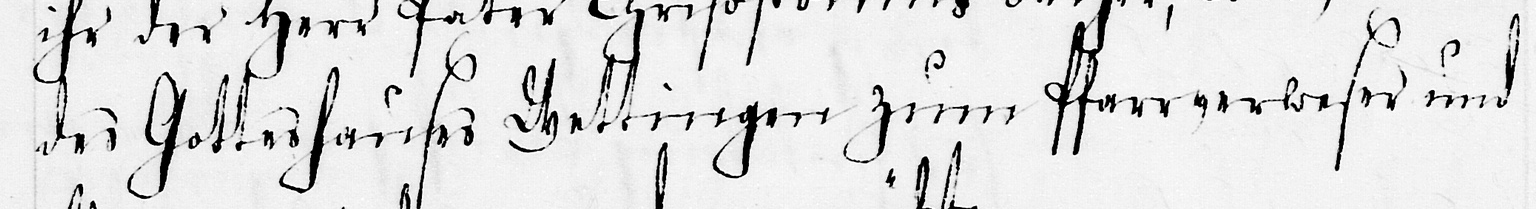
des Gotteshauses Wettingen zum Pfarrverweser und
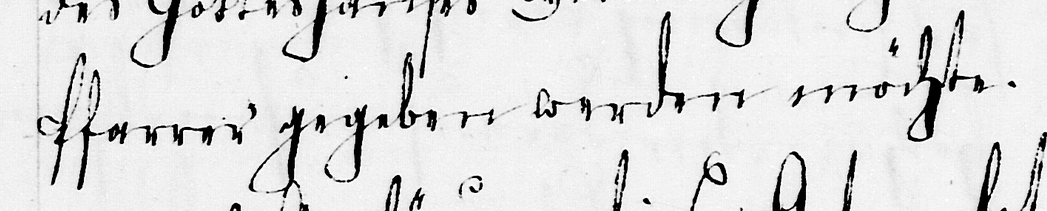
Pfarrer gegeben werden möchte.
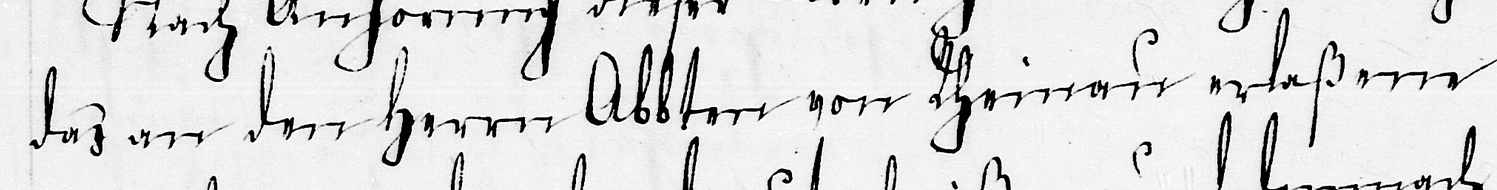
das an den Herrn Abbten von Rheinau erlaßene
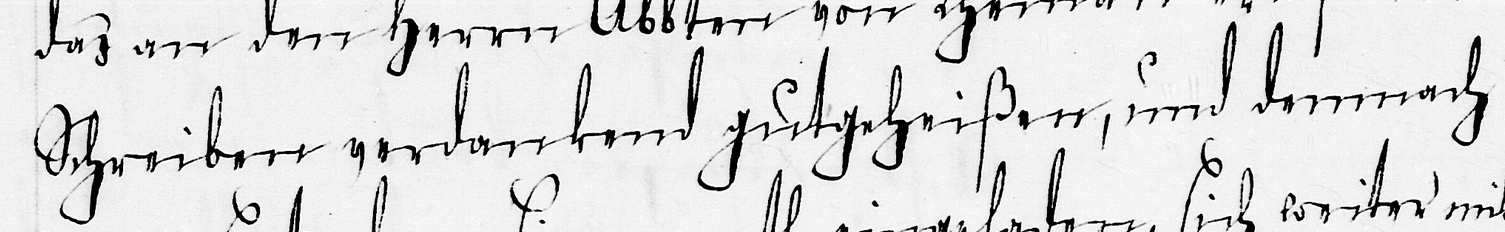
Schreiben verdankend gutgeheißen, und demnach
